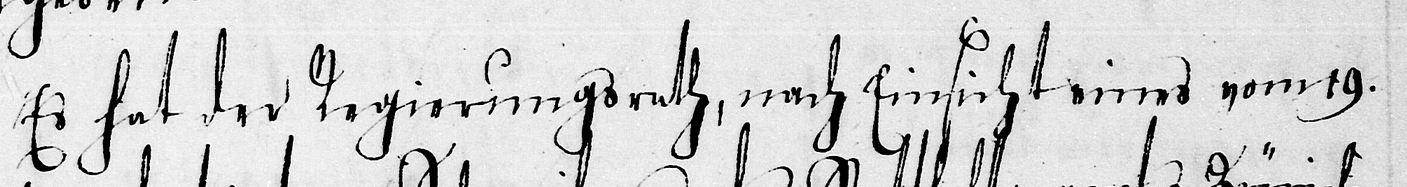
Es hat der Regierungsrath, nach Einsicht eines vom 19.
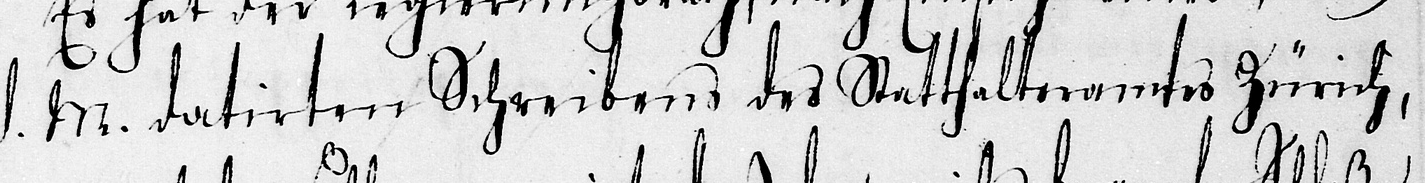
M. datirten Schreibens des Statthalteramtes Zürich,
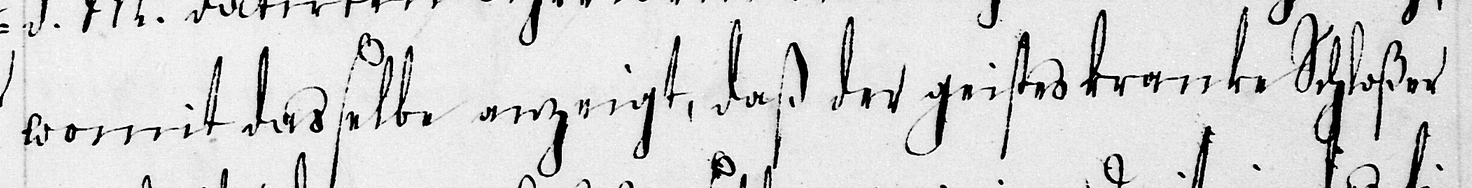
womit dasselbe anzeigt, daß der geisteskranke Schloßer
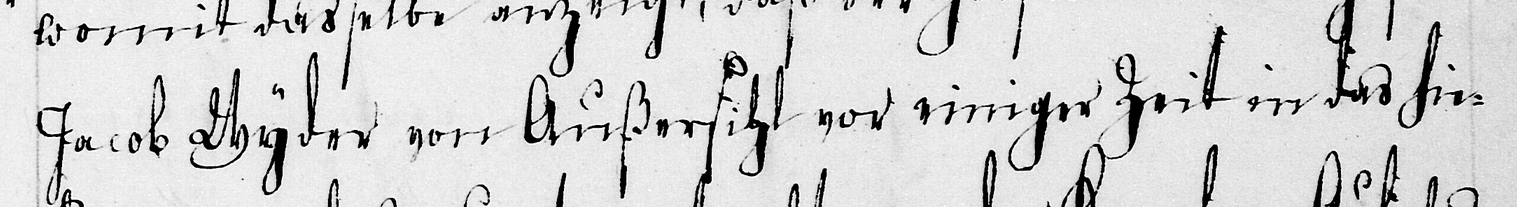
Jacob Wyder von Außersihl vor einiger Zeit in das hie¬
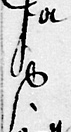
d.
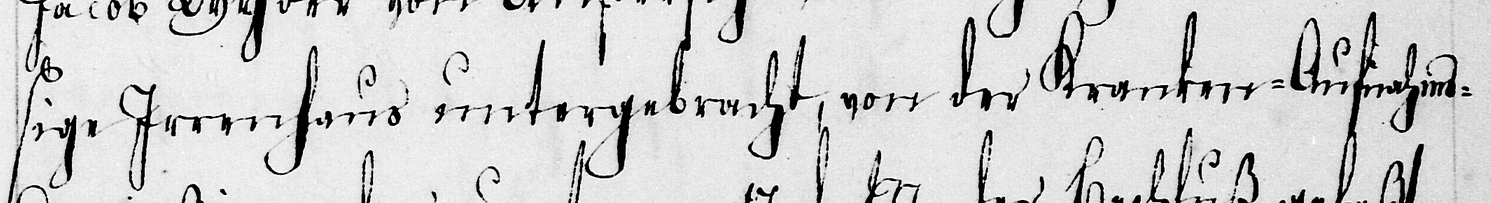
sige Irrenhaus untergebracht, von der Kranken-Aufnahm¬
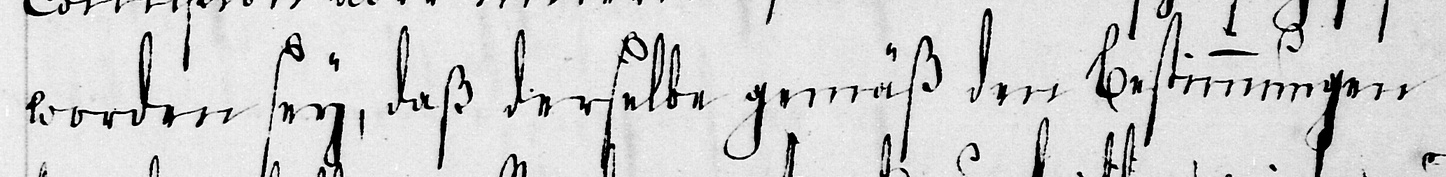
worden sey, daß derselbe gemäß den Bestimmungen
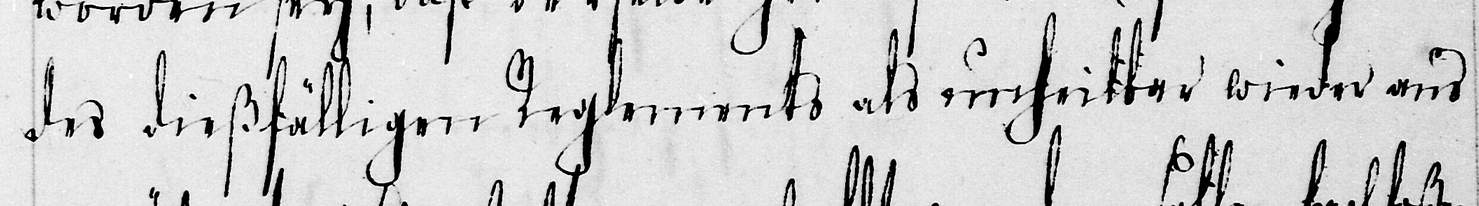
des dießfälligen Reglements als unheilbar wieder aus
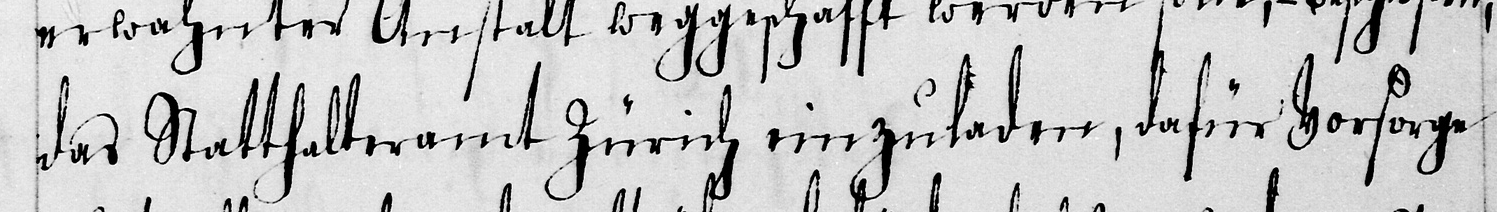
das Statthalteramt Zürich einzuladen, dafür Vorsorge
